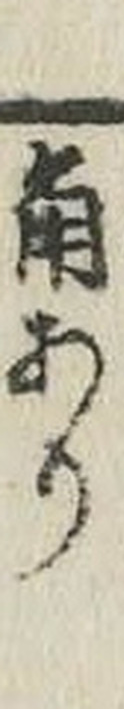角あり
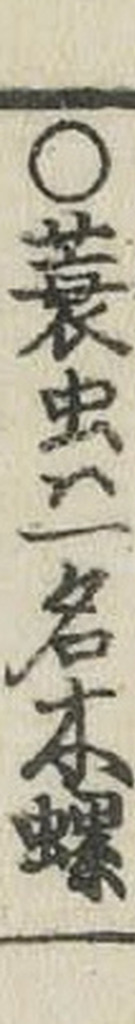○蓑虫は一名木螺
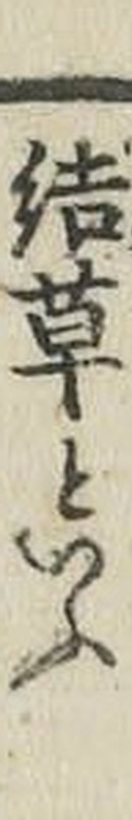結草といふ
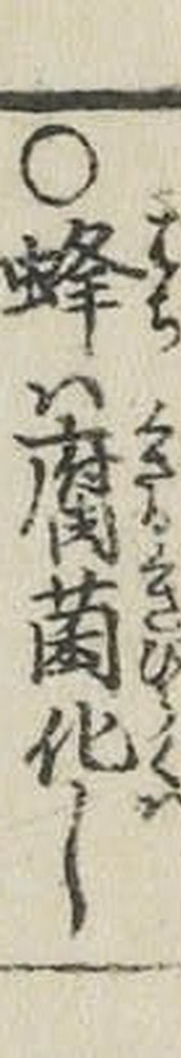○蜂は腐菌化し
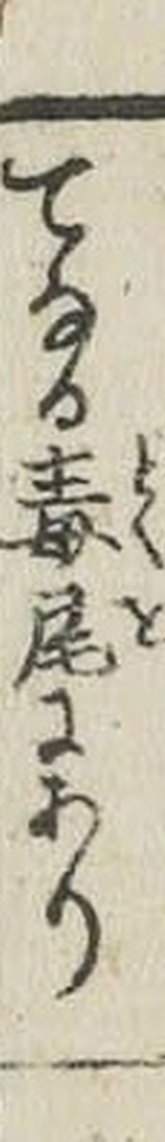てなる毒尾にあり
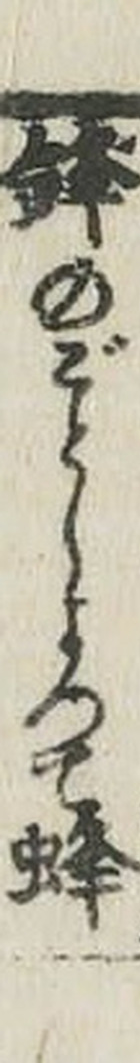鋒のごとしよつて蜂
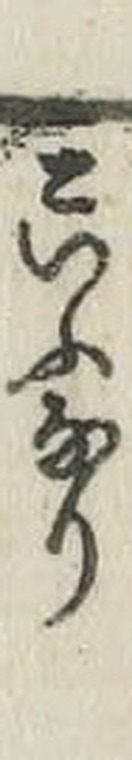といふなり
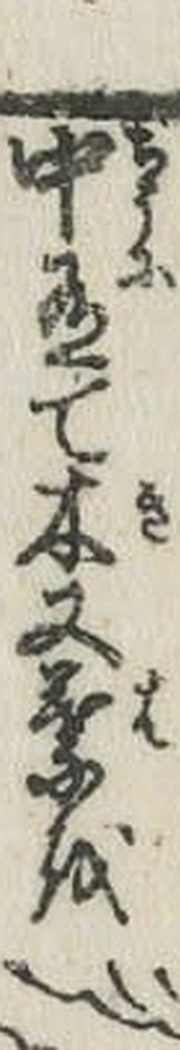中有て木又葉を
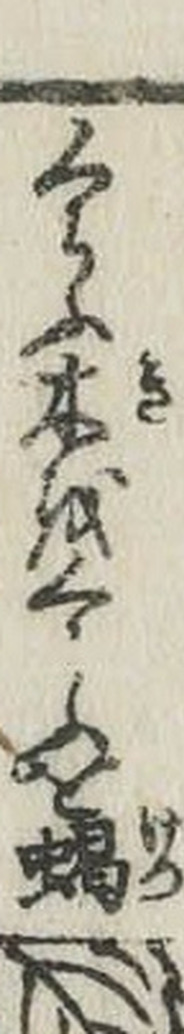くらふ木をくらふを蝎
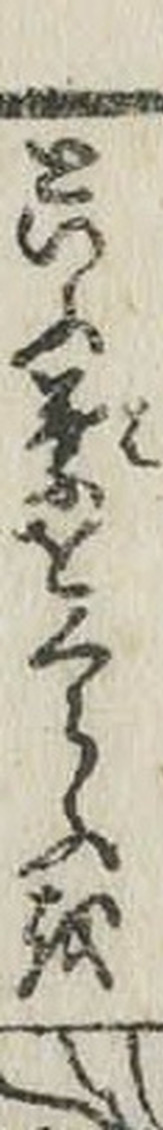といふ葉をくらふを
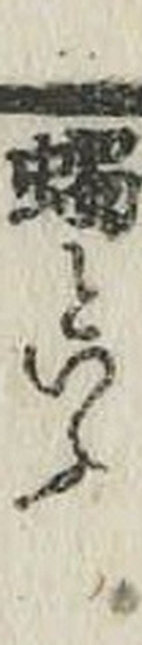蠋といふ
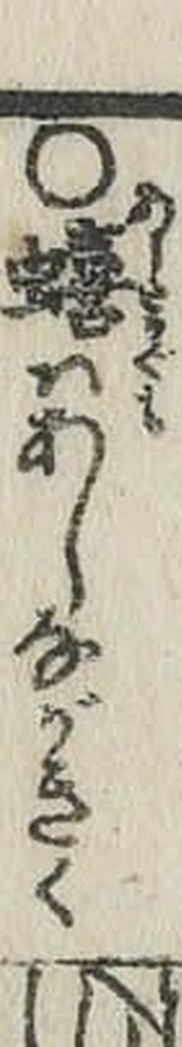○蟢はあしながきく
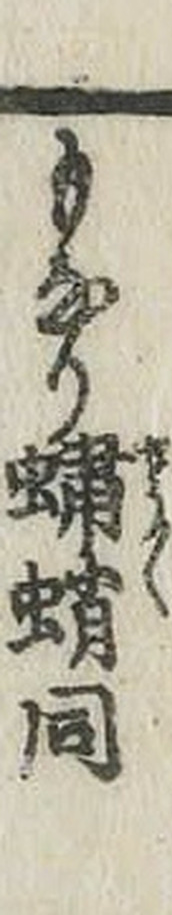もなり蟰蛸同
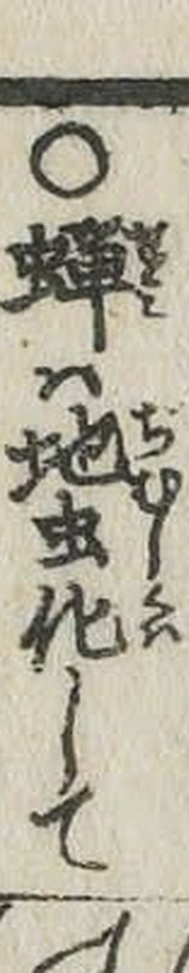○蝉は地虫化して
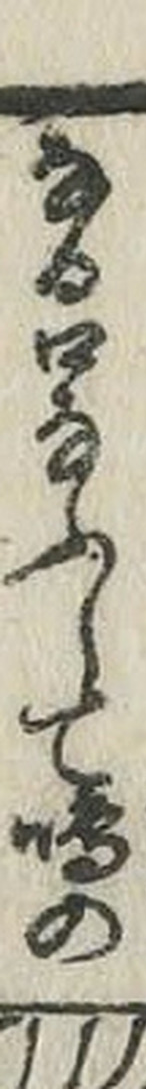なる口なふして鳴の
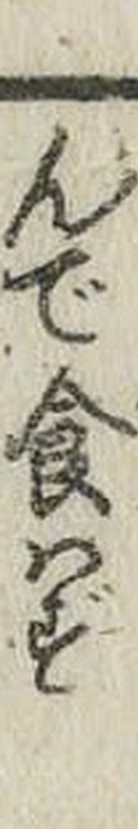んで食はず
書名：増補頭書訓蒙図彙大成 10巻 7:巻之14-16
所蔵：東京学芸大学教育コンテンツアーカイブ
